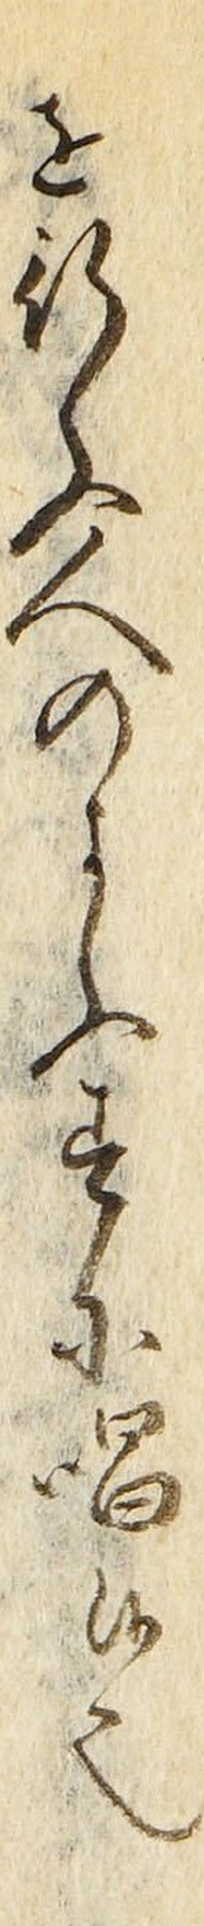を行ふ人のよふすに唱候也
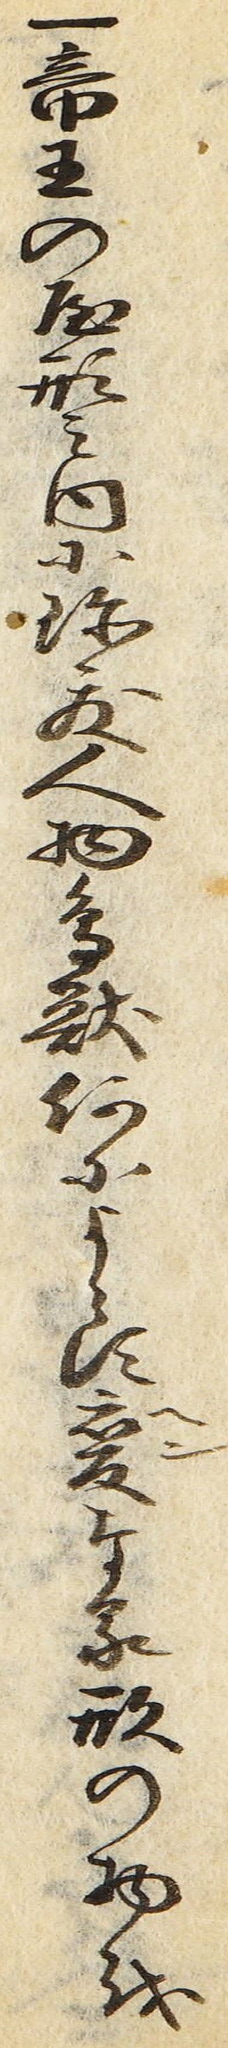一帝王の屋形之内に珍敷人物鳥獣何によらす変なる形の物を
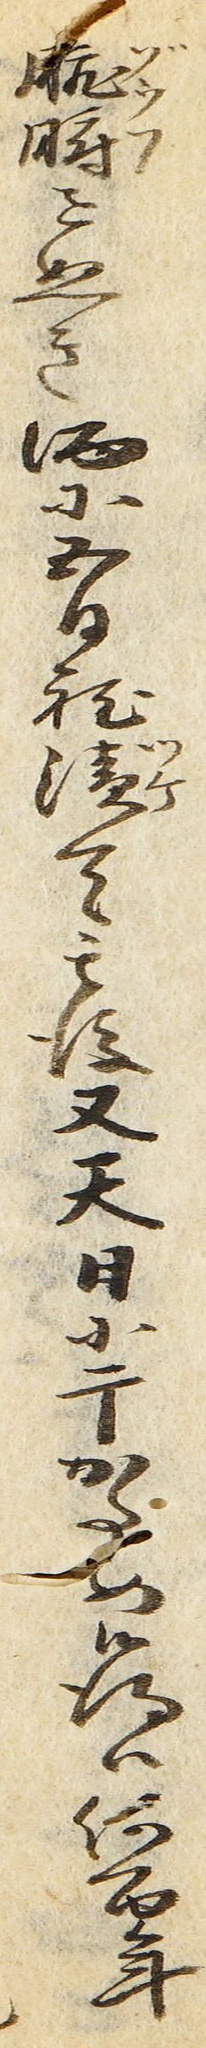臓腑をぬき酒に五日程漬て其後又天日に干かため候得は何百年
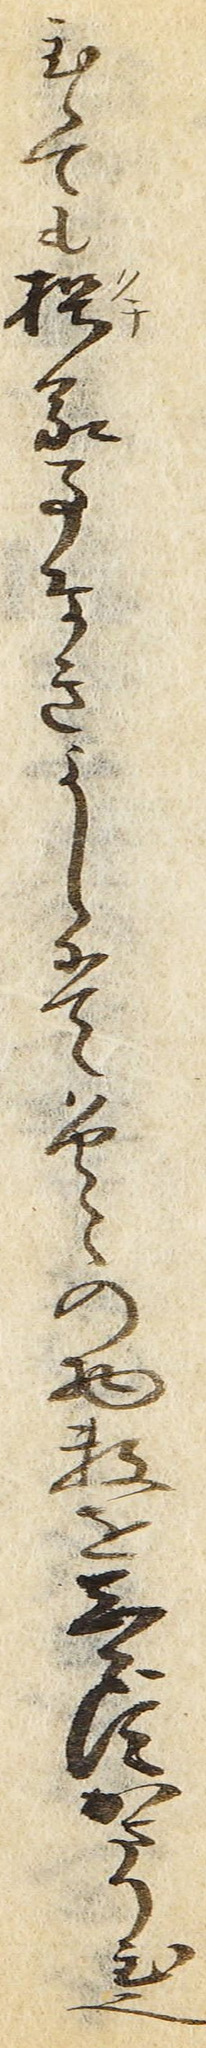置候ても朽る事なきよしにて色々の物数をしらすかさり置也
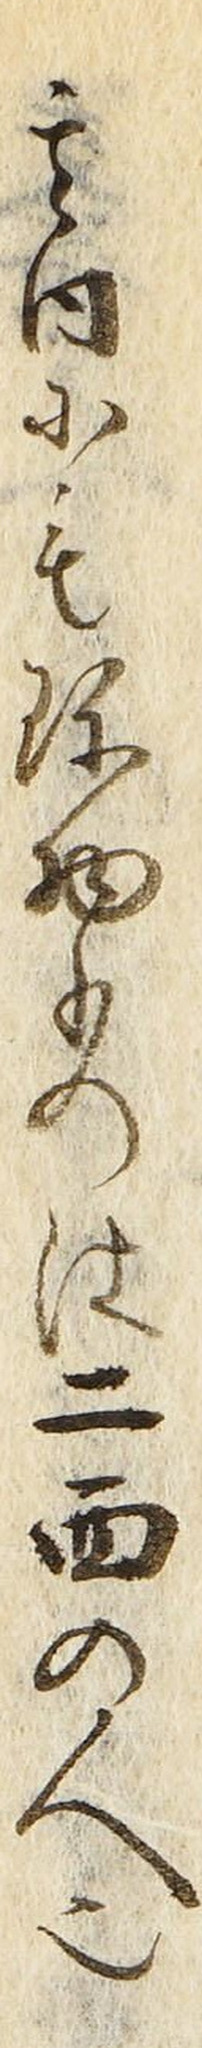其内にも珍物ものは二面の人也
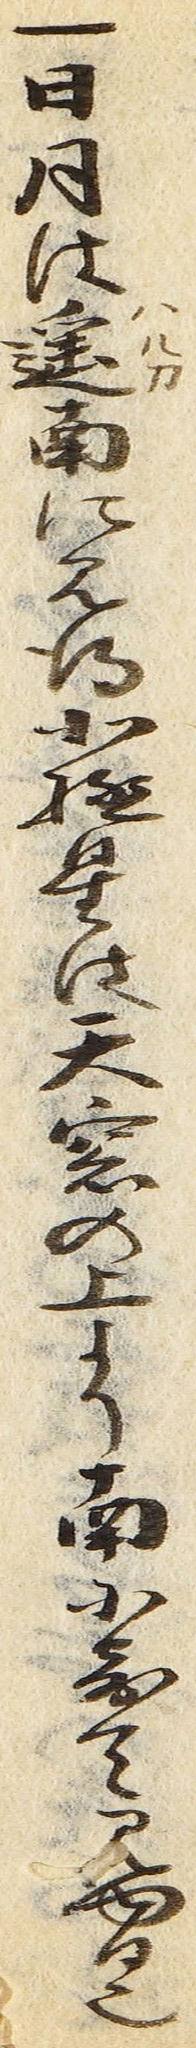一日月は遥南に見得北極星は天窓の上より南に寄てみ見ゆる也
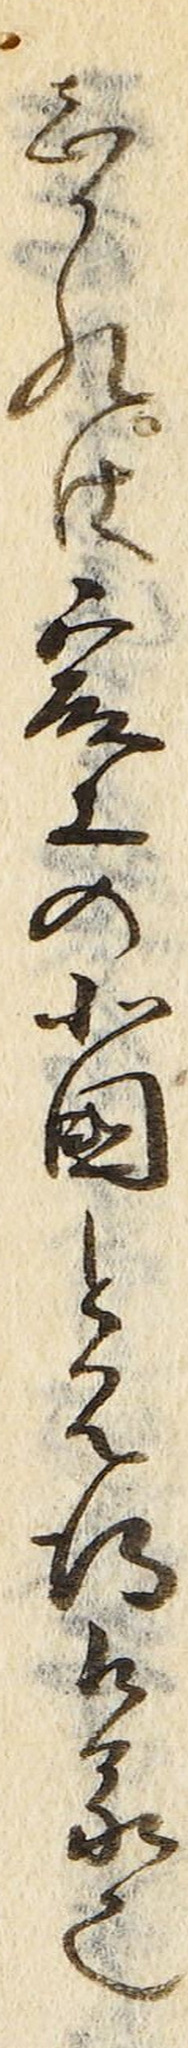しかれは最上の北国と見得ける也
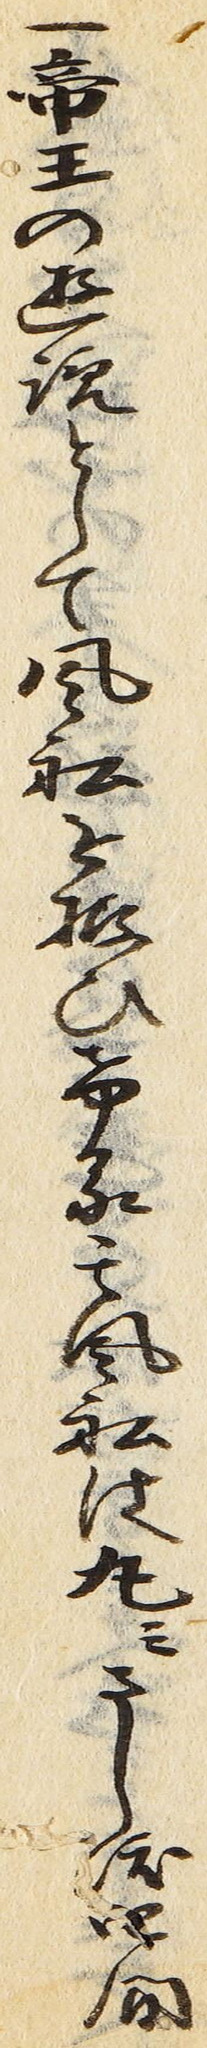一帝王の遊覧として風船を拵ひける其風船は丸みさし渡四間
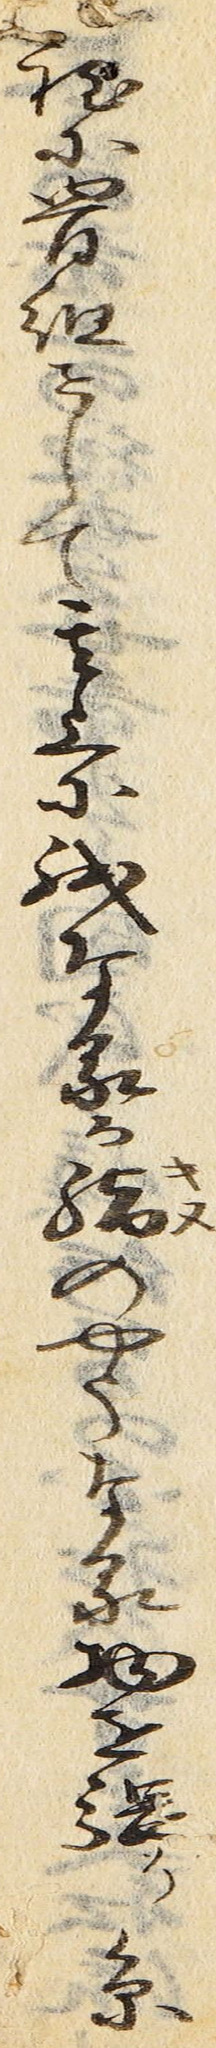程に骨組をして其上に紙なるか絹のやうなる物を張り糸
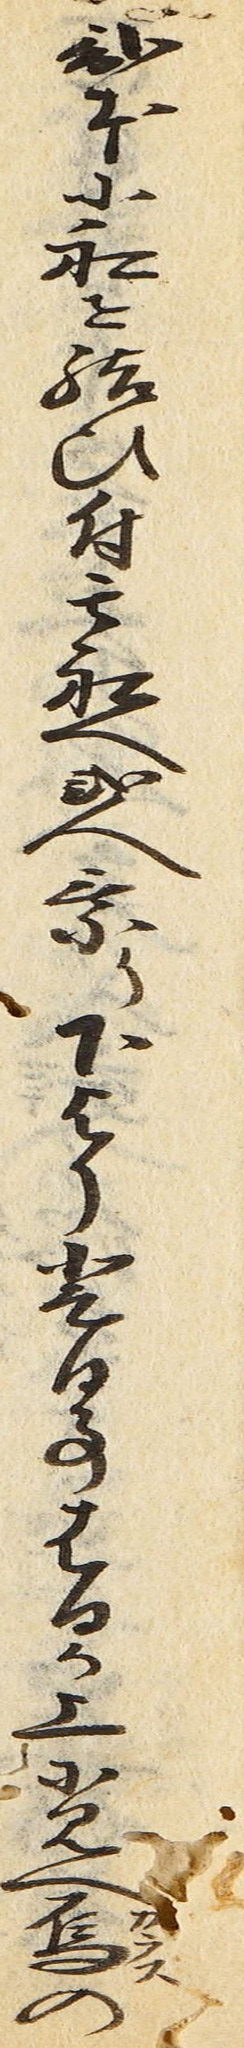弐本に船を結ひ付其船へ弐人乗り下より登る事はるか上に見へ烏の
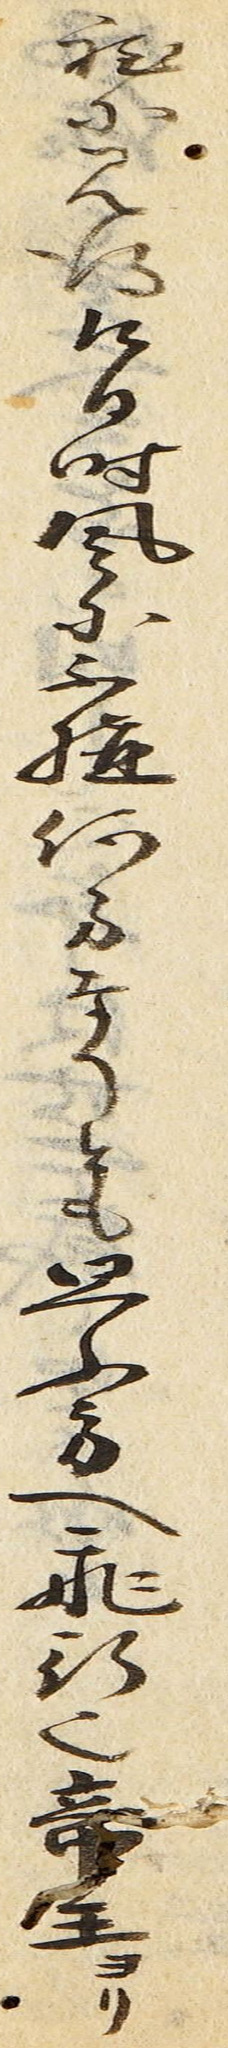程に見得ける時風に不構何方なりとも思ふ方へ飛行く也帝王より
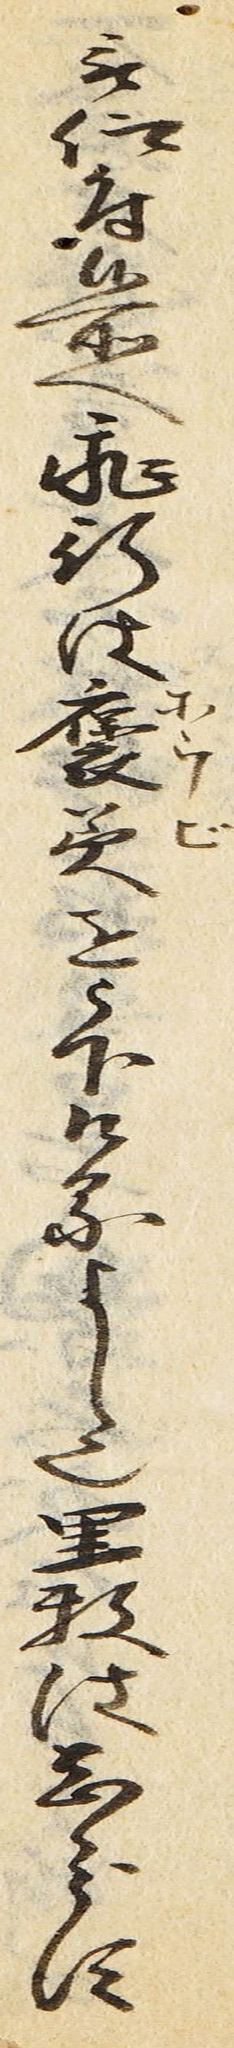被仰付候所へ飛行は褒美を被下けるよし也里数はしらす
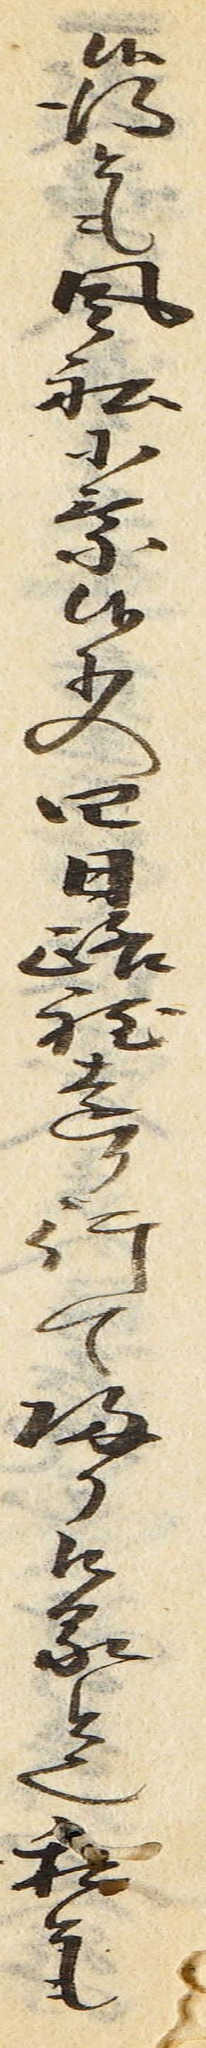候得とも風船に乗候もの四日路程遠く行て帰りけると也私とも
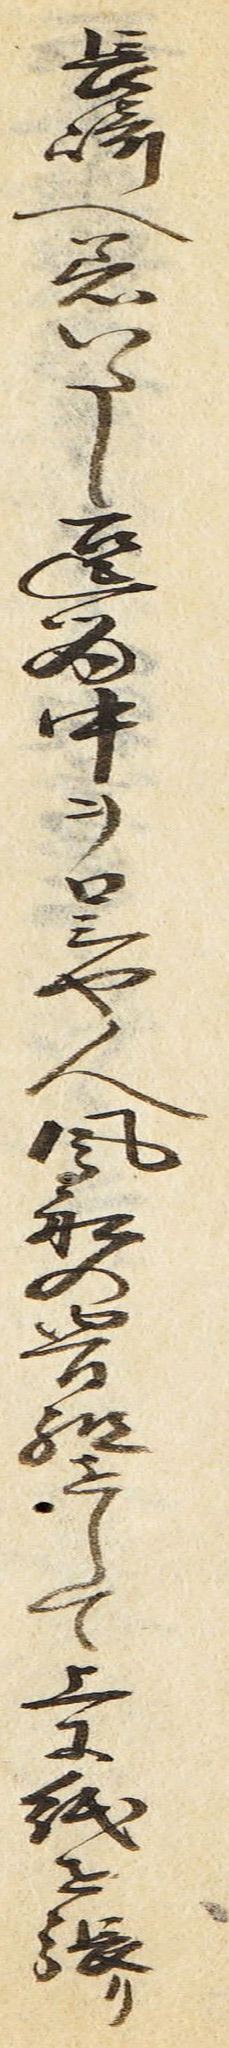長崎へ着いたし逗留中ヲロシヤ人風船の骨組をして上に紙を張り
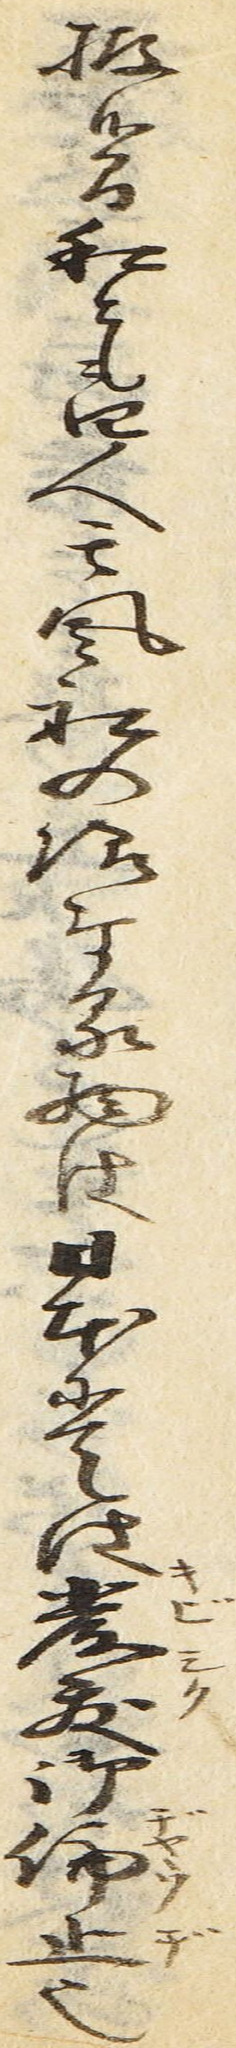拵候間私とも四人其風船の様なる物は日本にては厳敷御停止也
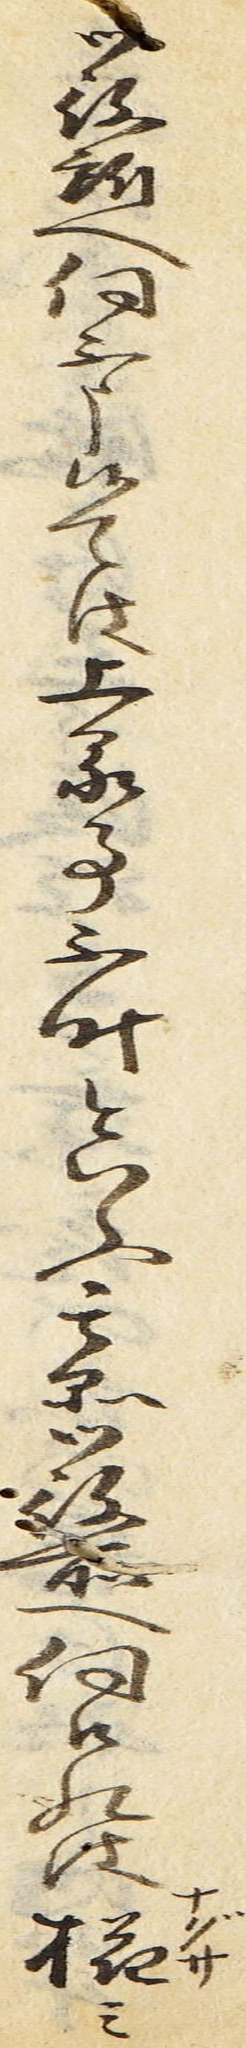御役所へ伺不申候ては上る事不叶といふ其品御役所へ伺けれは椛み
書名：外国漂流記
